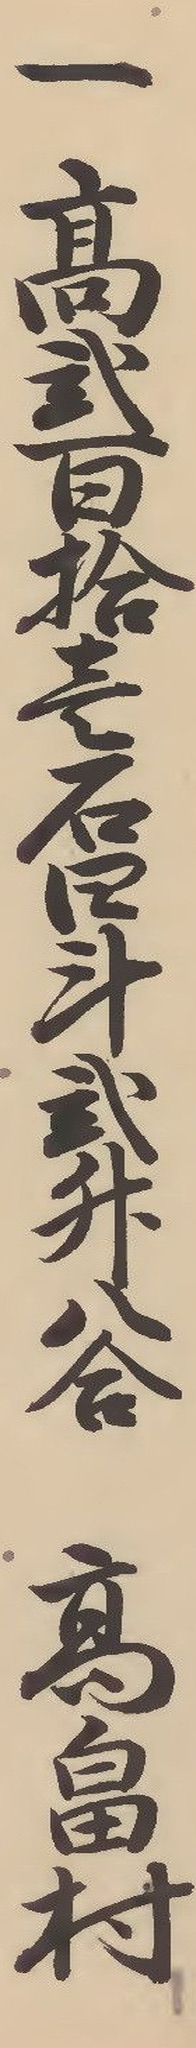一高弐百拾壱石四斗弐升八合高畠村
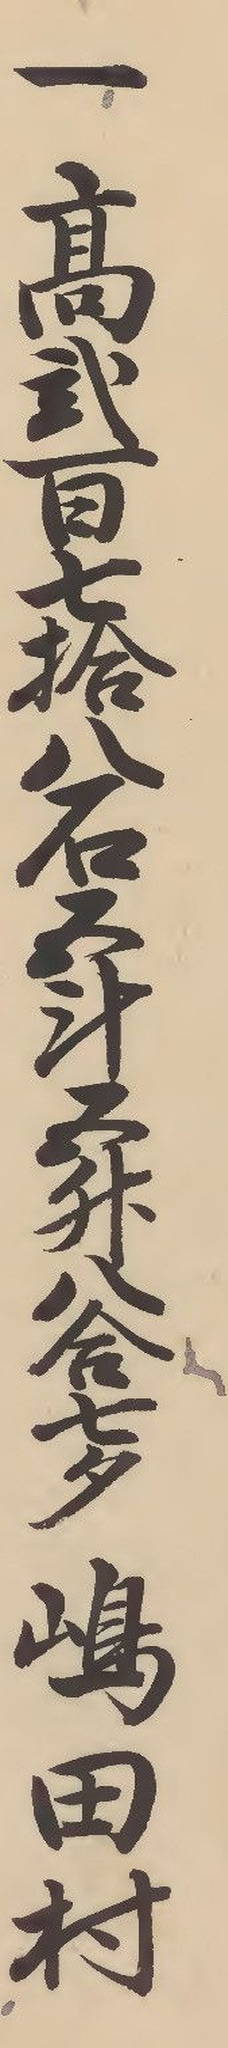一高弐百七拾八石五斗五升八合七勺島田村
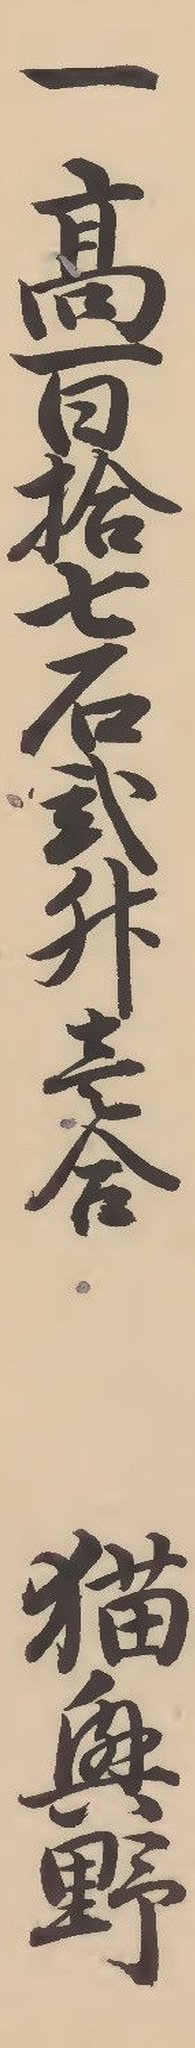一高百拾七石弐升壱合猫興野

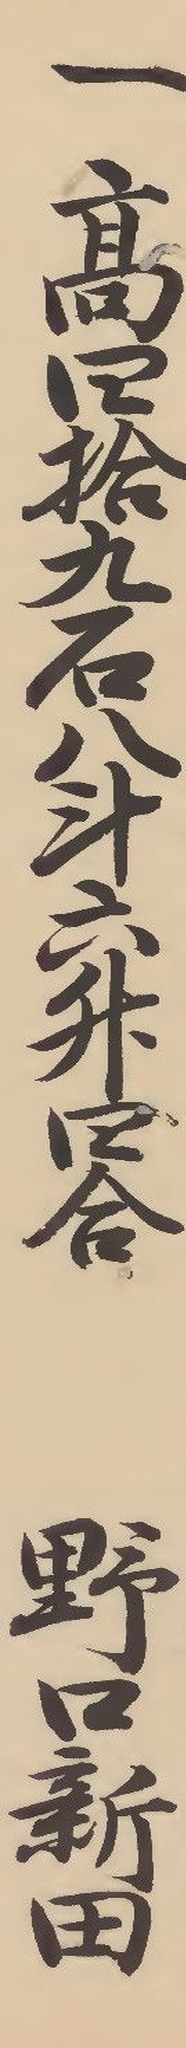一高四拾九石八斗六升四合野口新田
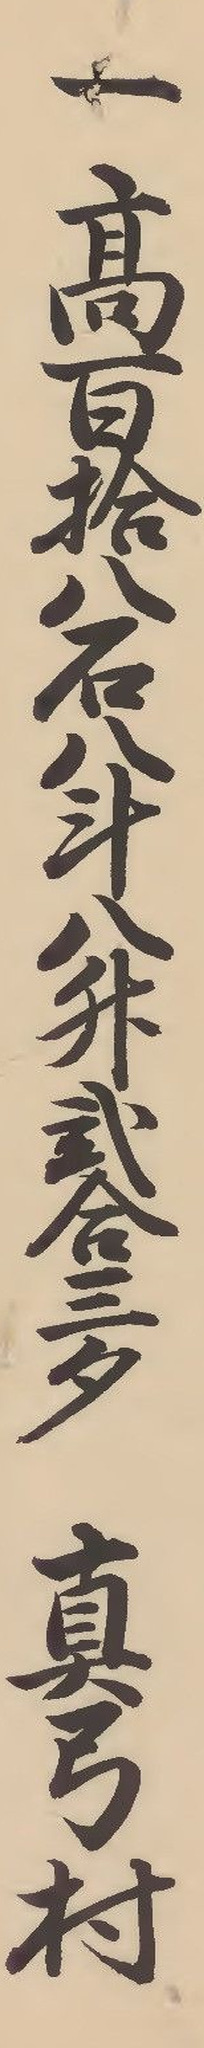一高百拾八石八斗八升弐合三勺真弓村
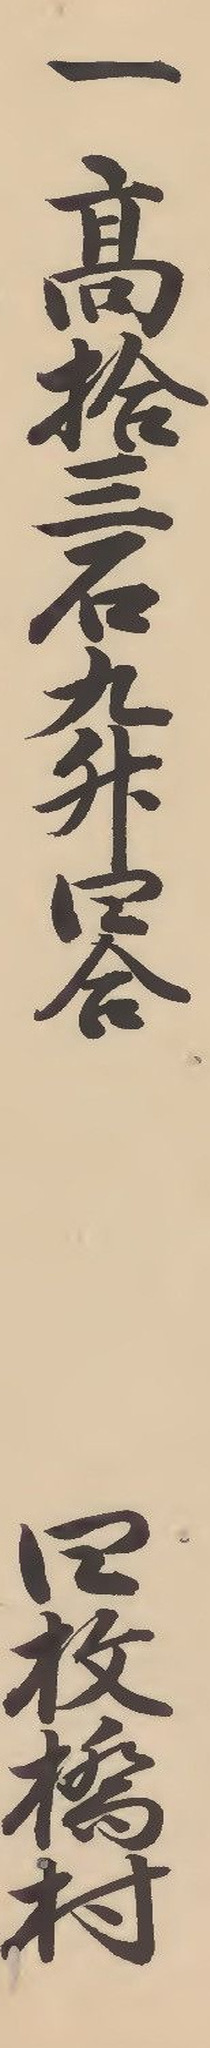一高拾三石九升四合四枚橋村
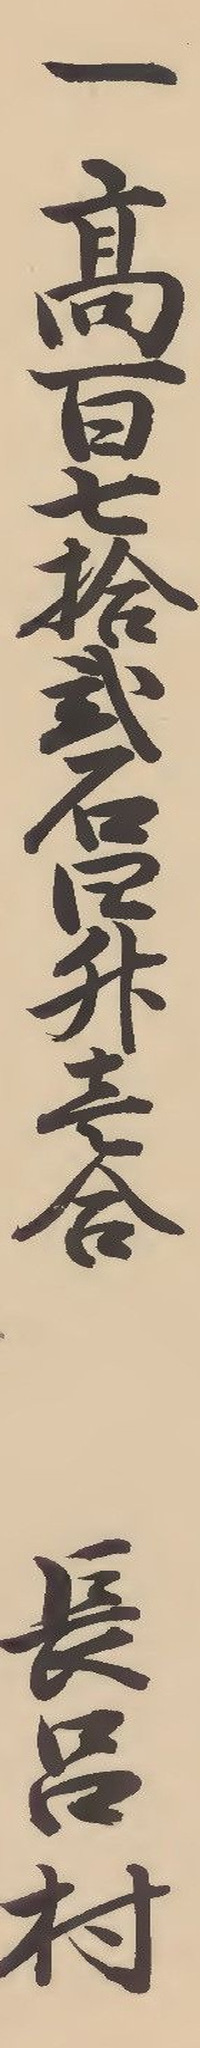一高百七拾弐石四升壱合長呂村
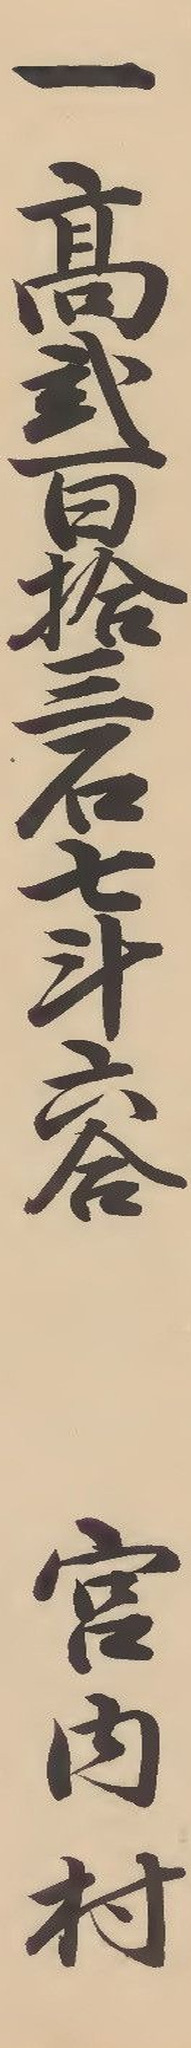一高弐百拾三石七斗六合宮内村
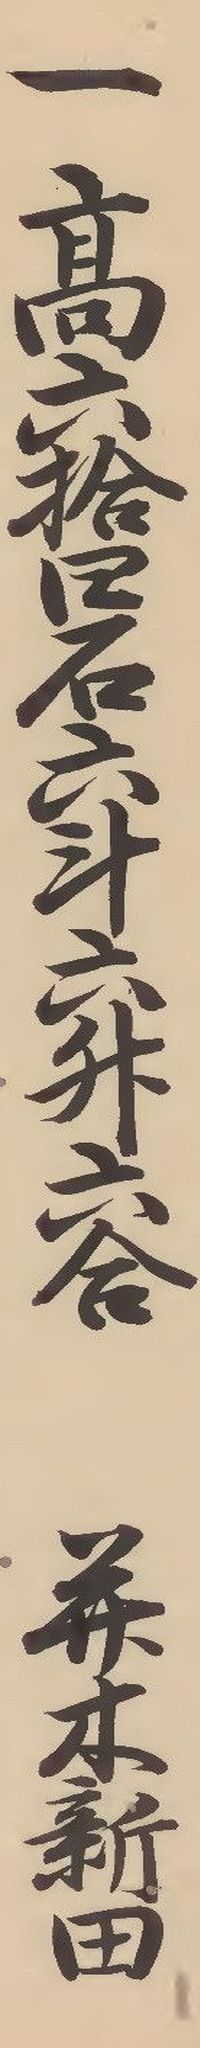一高六拾四石六斗六升六合并木新田
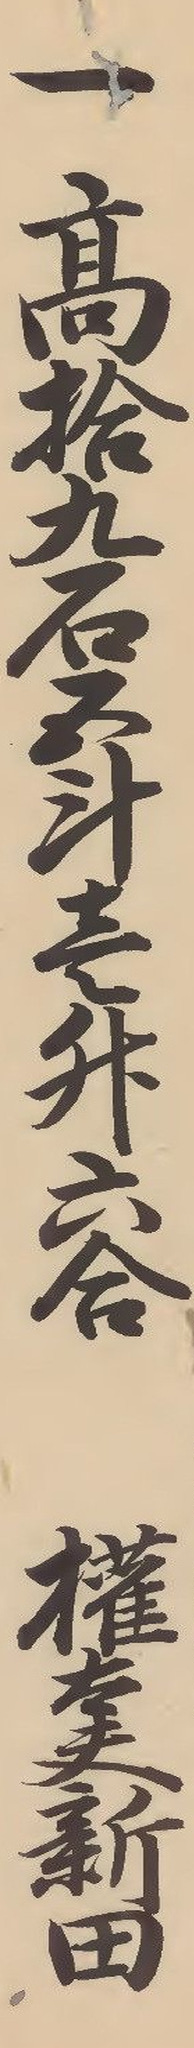一高拾九石五斗壱升六合権太夫新田
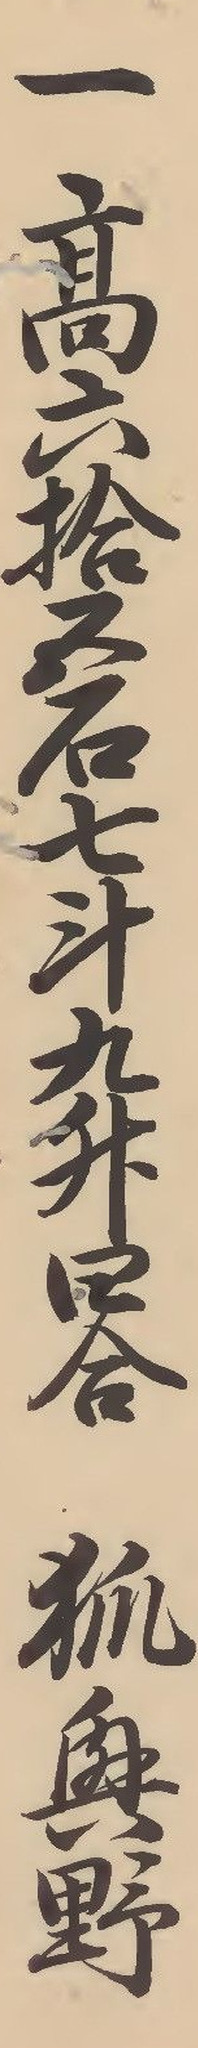一高六拾五石七斗九升四合狐興野

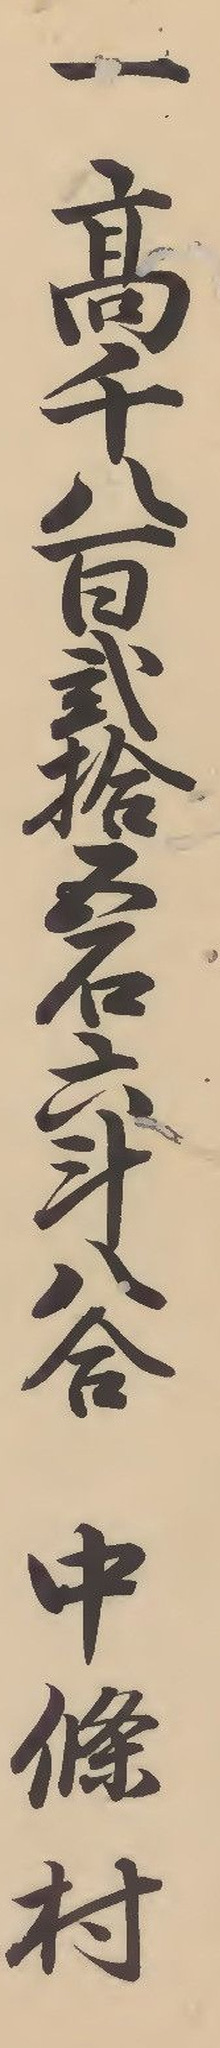一高千八百弐拾五石六斗八合中条村
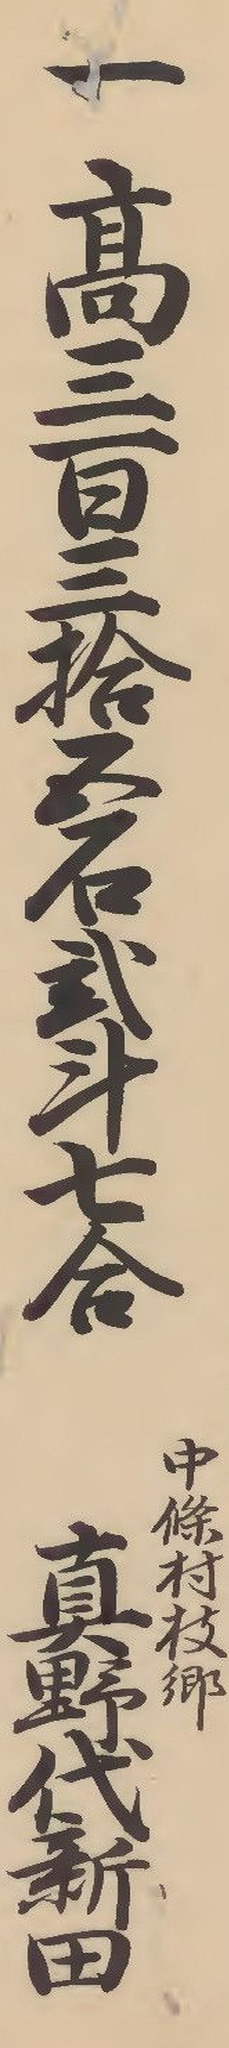一高三百三拾五石弐斗七合真野代新田
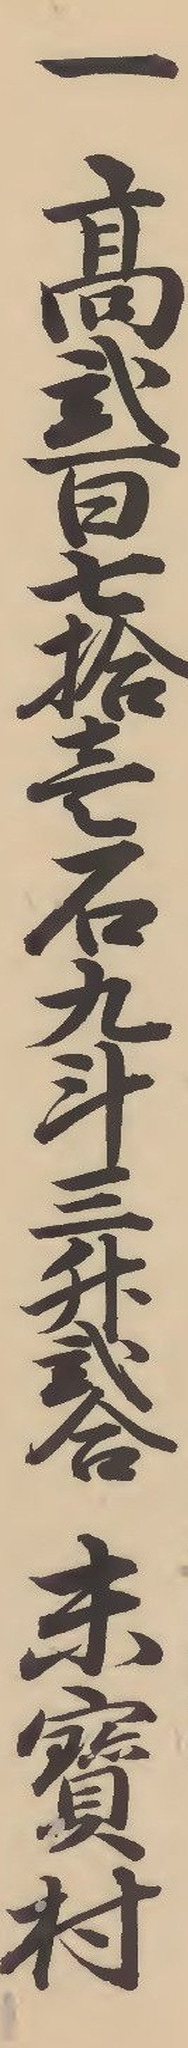一高弐百七拾壱石九斗三升弐合末宝村
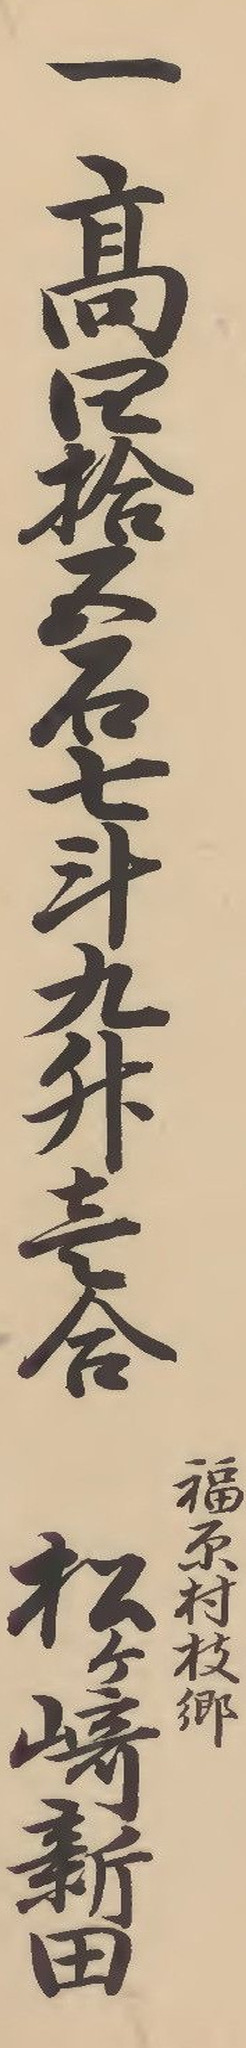一高四拾五石七斗九升壱合松ヶ崎新田
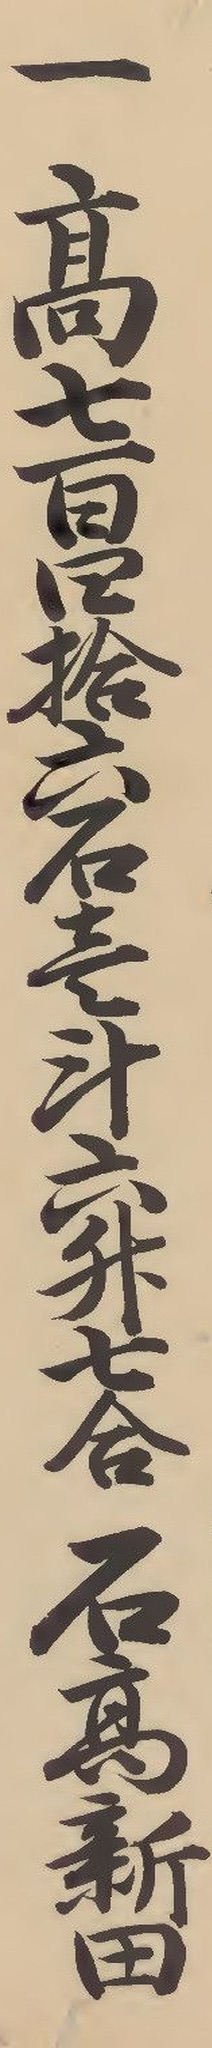一高七百四拾六石壱斗六升七合石高新田
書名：越後国郷帳　下
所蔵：国立公文書館 National Archives of Japan
